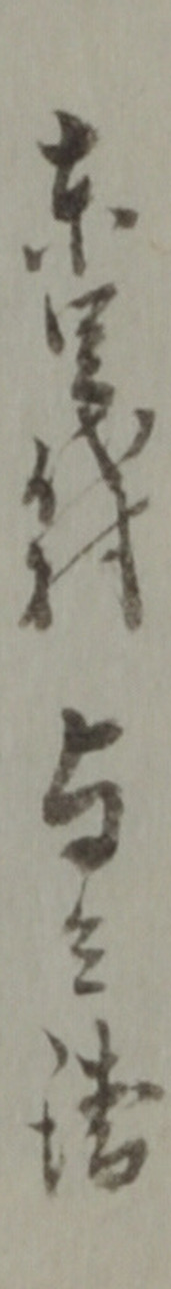東足代村与兵衛
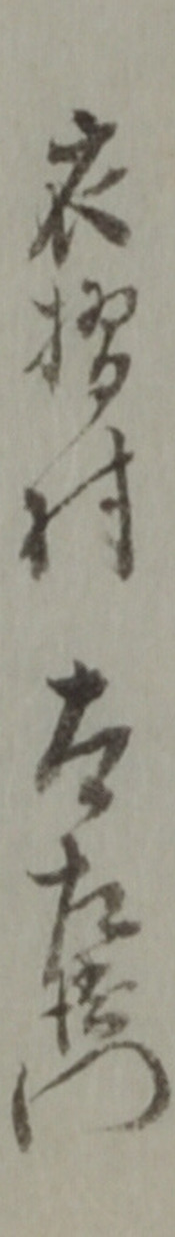衣摺村太左衛門
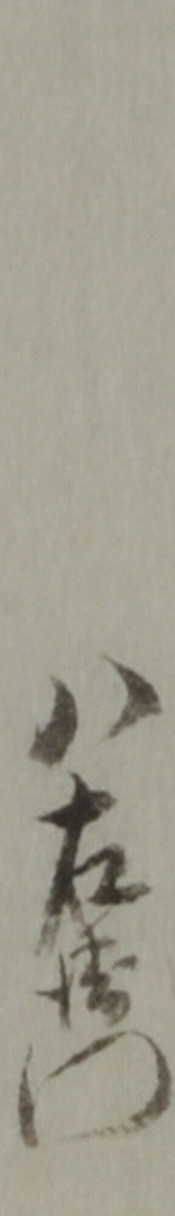伝左衛門
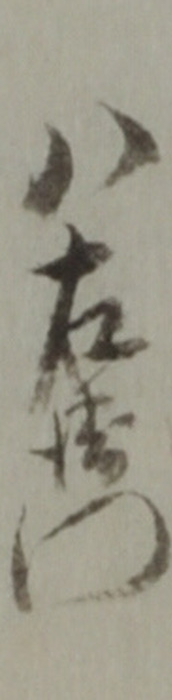伝左衛門
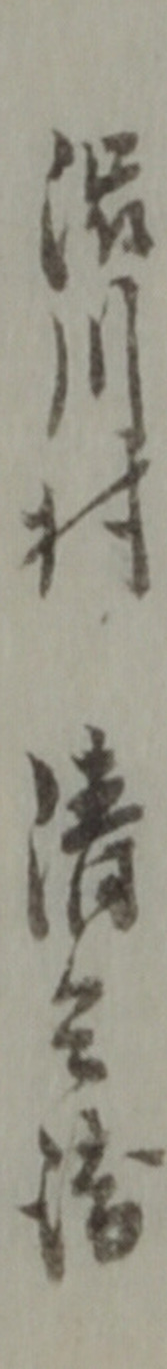渋川村清兵衛
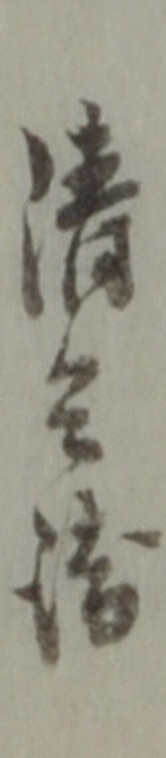太兵衛
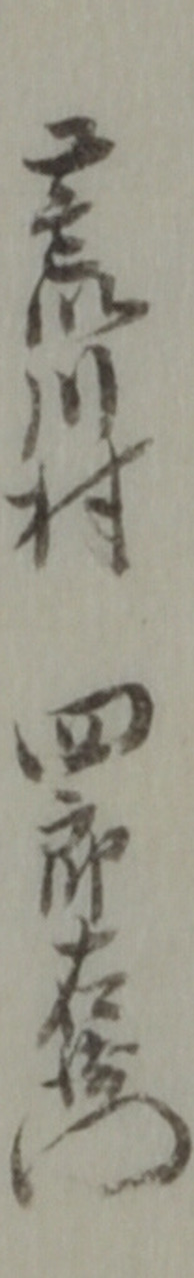荒川村四郎右衛門
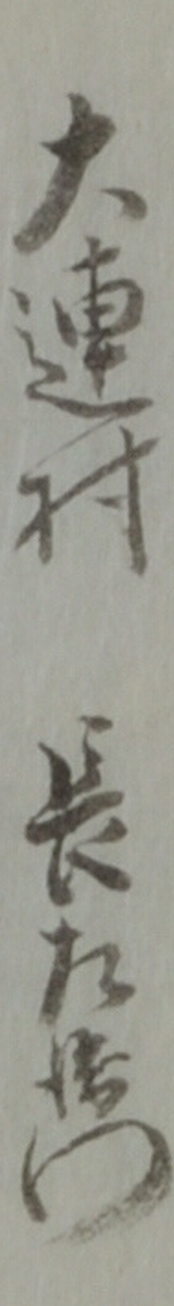大連村長左衛門
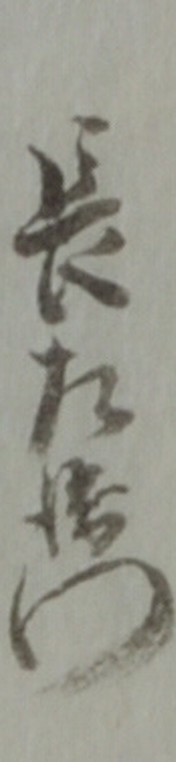伝左衛門
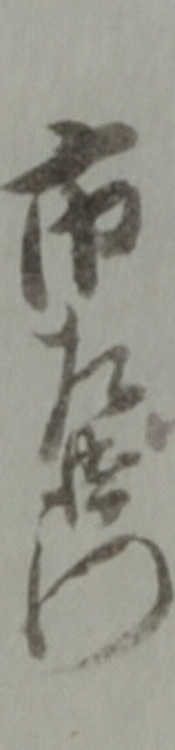市左衛門
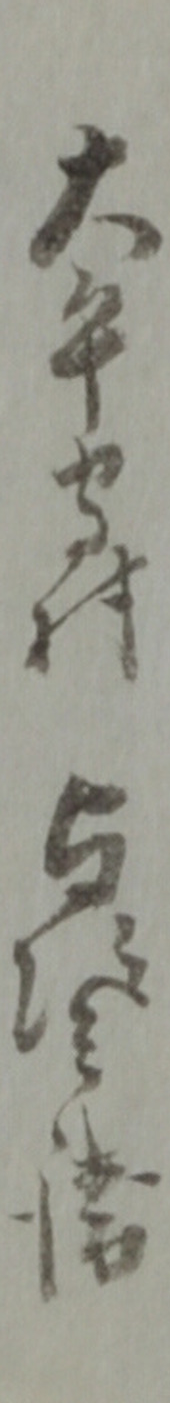大平寺村与次兵衛
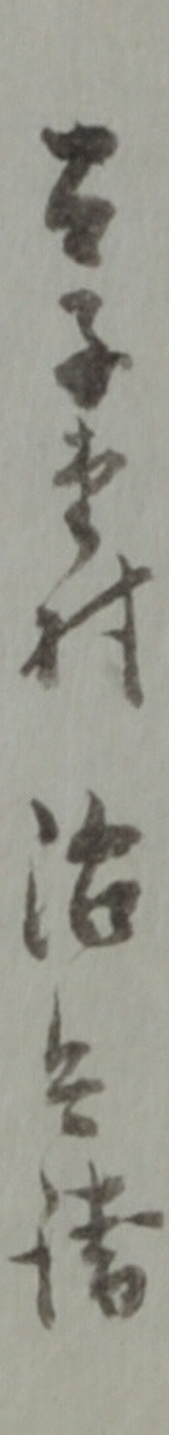太子堂村治兵衛
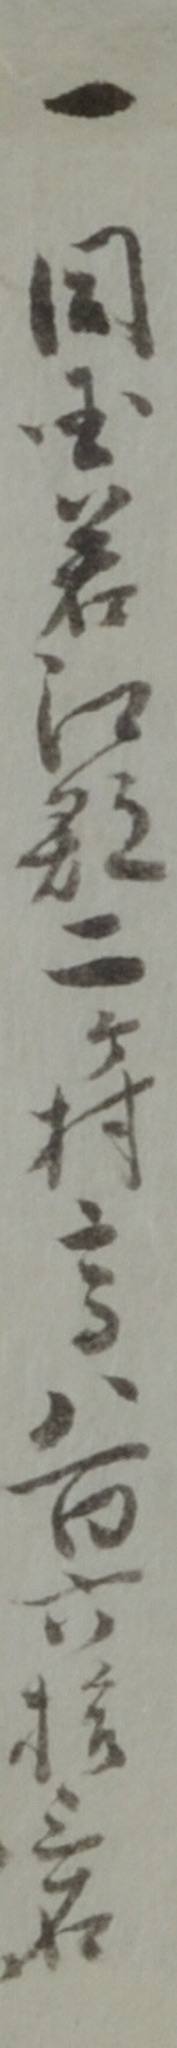一同国若江郡二ケ村高八百六拾三石
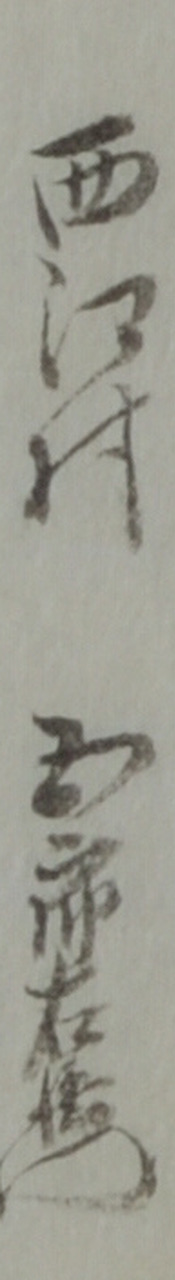西江村五郎右衛門
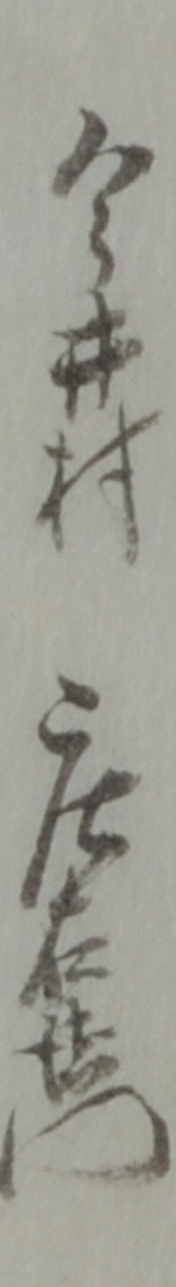今井村庄右衛門
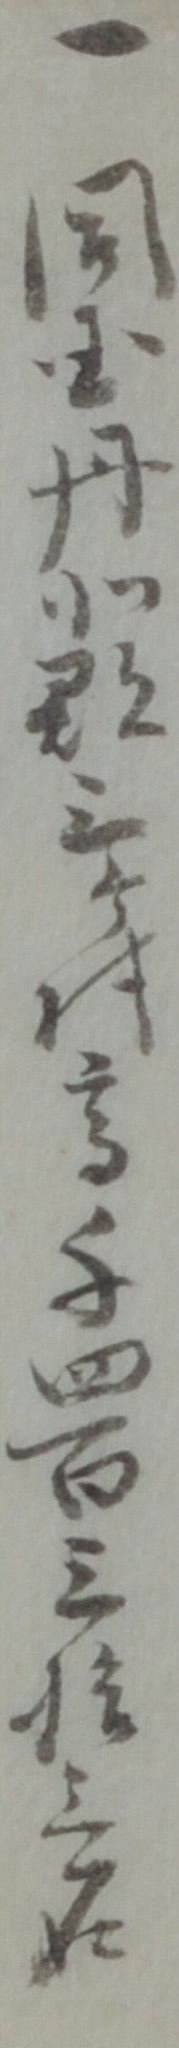一同国丹北郡三ケ村高千四百三拾三石
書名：内藤重頼公御代分限帳（写）
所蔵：伊那市立高遠町図書館・合同会社AMANE
